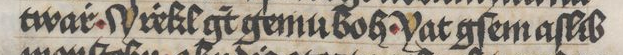twaṙ.Y ṙekl ḡt gemu boh.Yat gſem aſlib
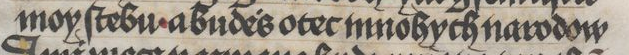moy ſtebu.a budeṡ otec mnohych narodow
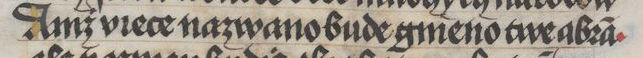Aniż viece nazwano bude gmeno twe abrā.
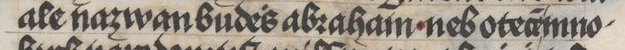ale nazwan budeṡ abraham.neb otecē mno¬
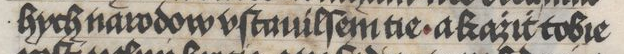hych narodow vſtauilſem tie.a każiṫ tobie
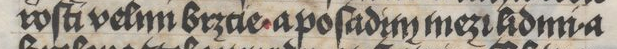roſti velmi brzcie.a poſadim mezi lidmi.a
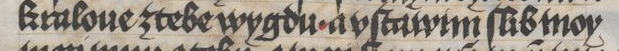kraloue ztebe wygdu.a yſtawím ſlib moy
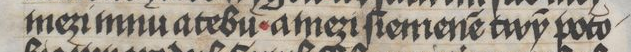mezi mnu atebu.a mezí ſiemenē twȳ poto¬
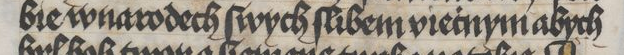bie wnarodech ſwych ſlibem vieċnym abych
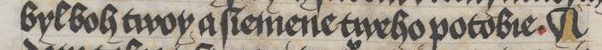byl boh twoy a ſiemene tweho potobie.A
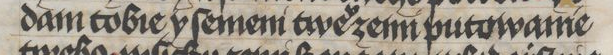dam tobie y ſemeni twev zemi putowaníe
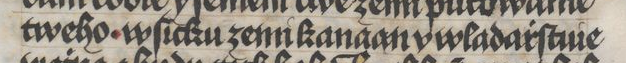tweho.wẛicku zemi kanaan y wladaṙſtuie
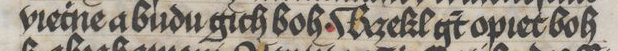vieċne a budu gich boh.Rzekl ḡt opiet boh
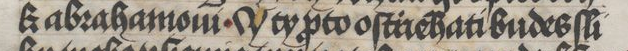k abrahamoui.Y ty ꝓto oſtṙiehati budes ſli¬
